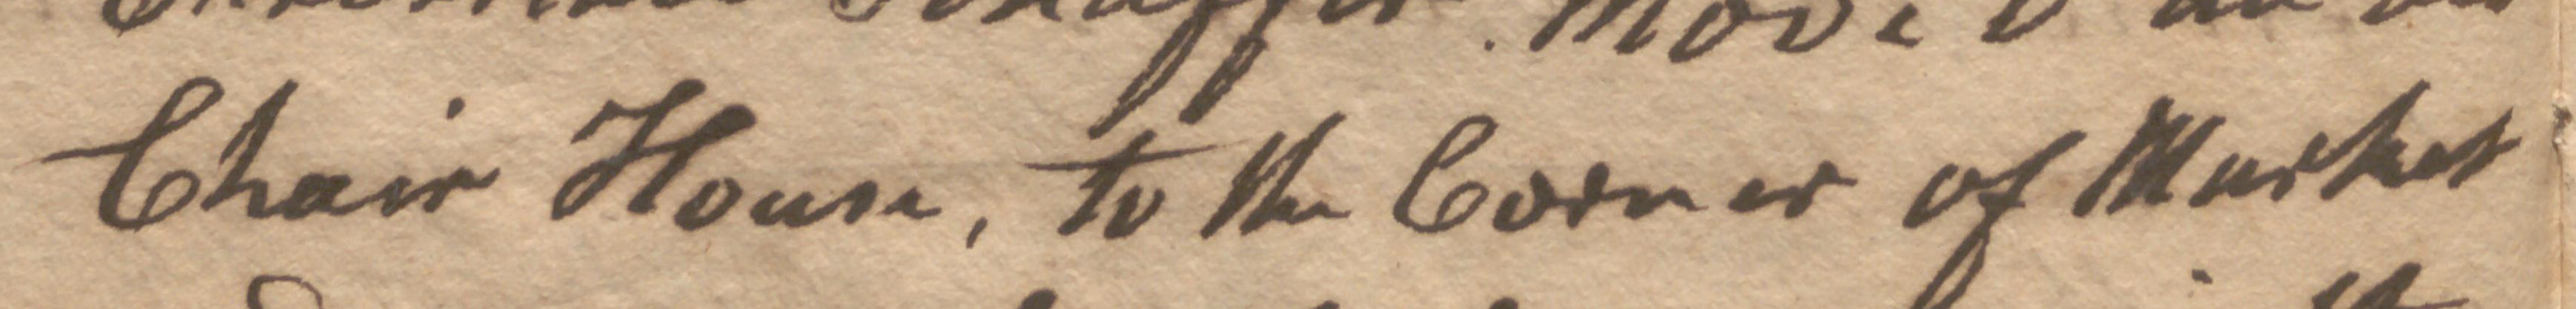Chair House, to the Corner of Market
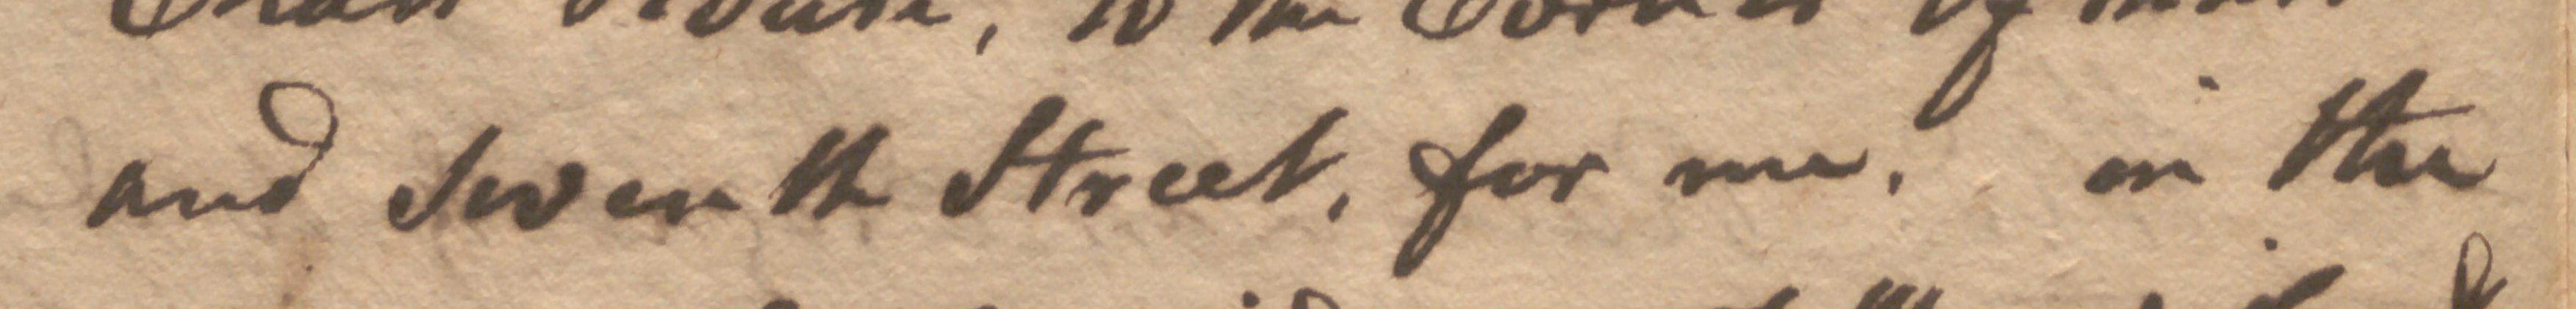and Seventh Street, for me. in the
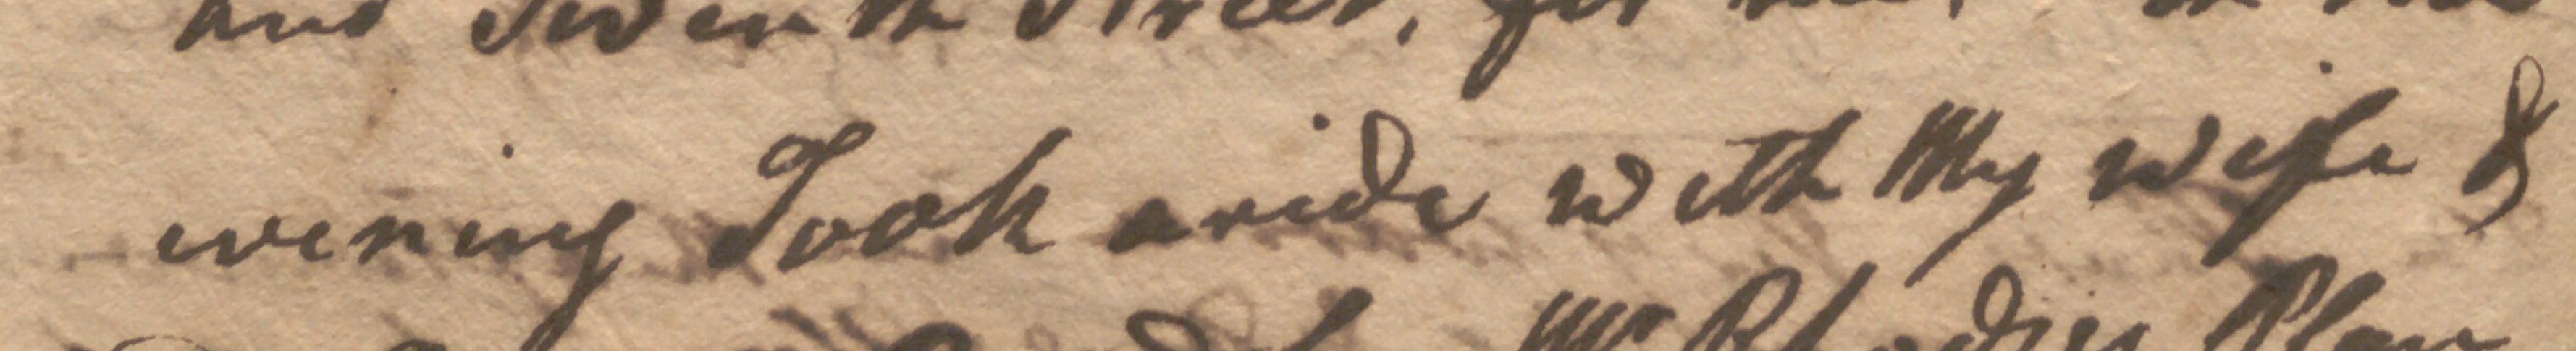evening Took a ride with My wife
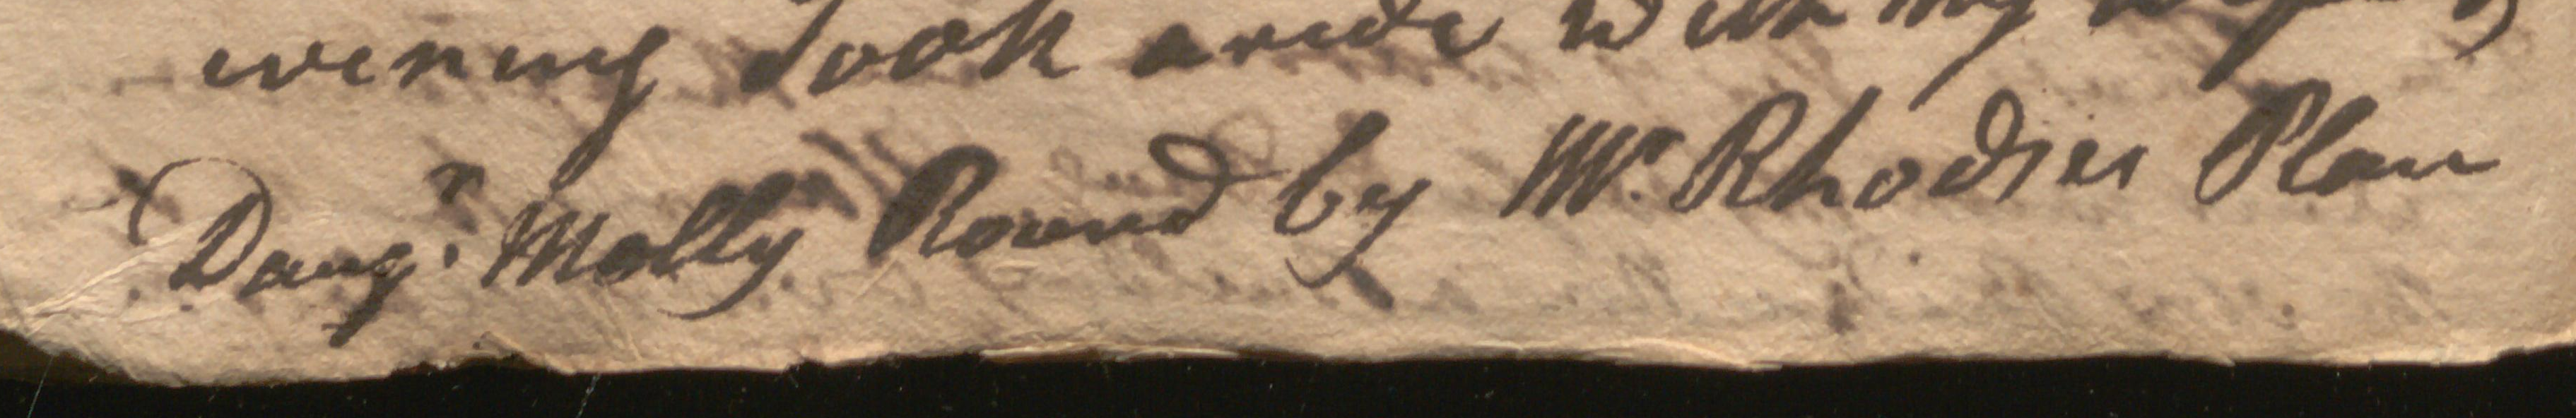Daug^r. Molly Round by M^r. Rhodses Plan
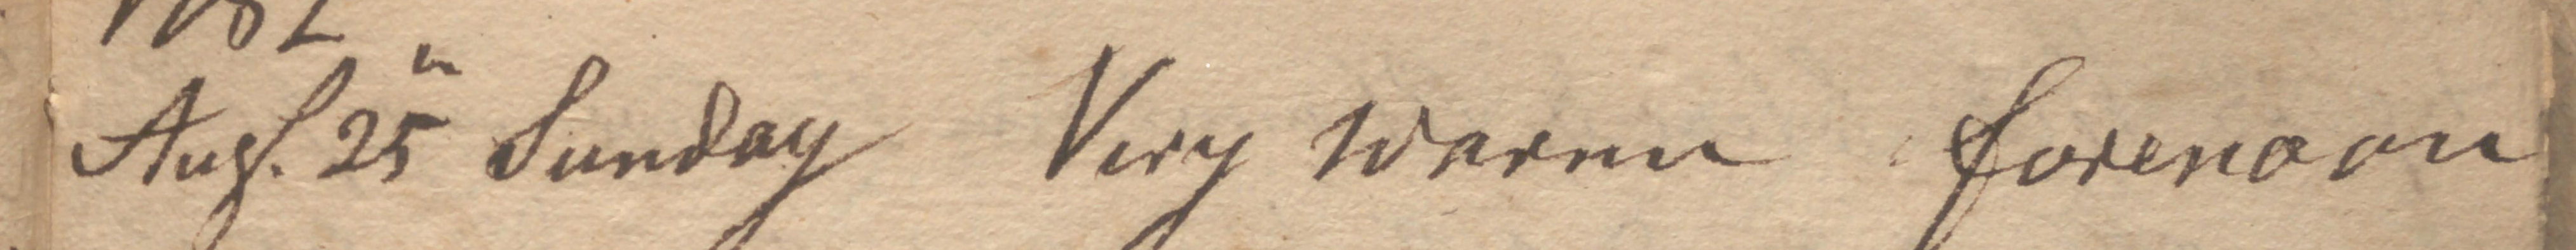Aug^t. 25^h Sunday Very Warme forenoon
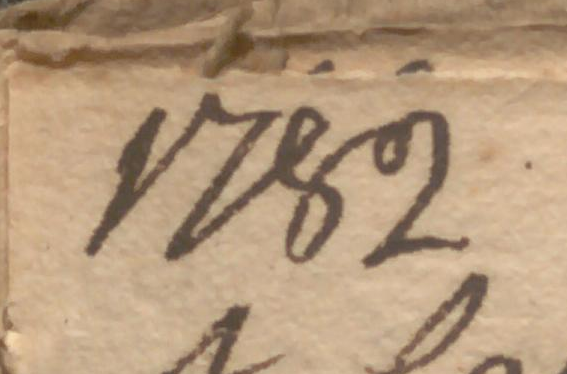1782
